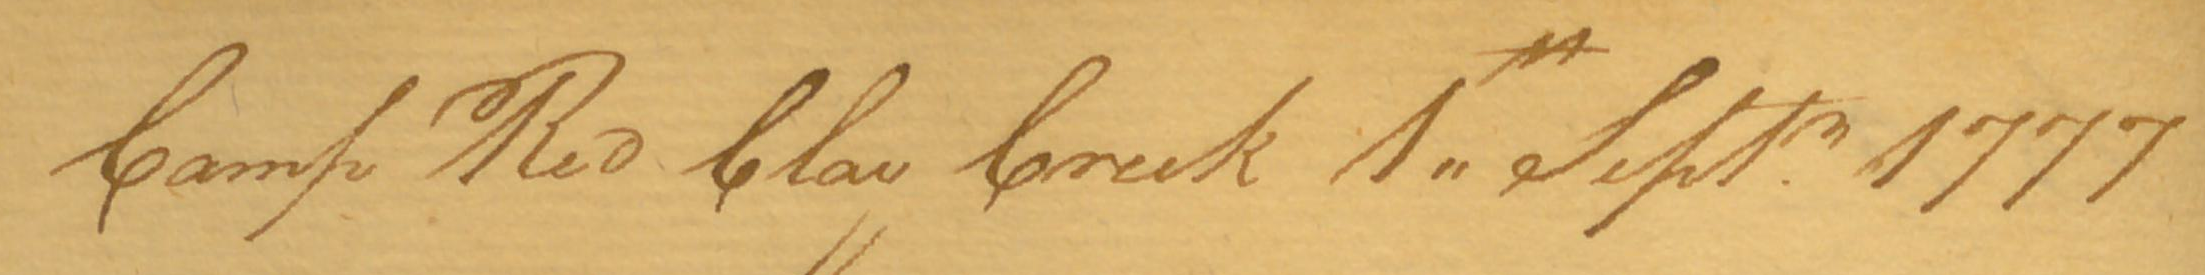Camp Red Clay Creek 1^st. Sept^r. 1777
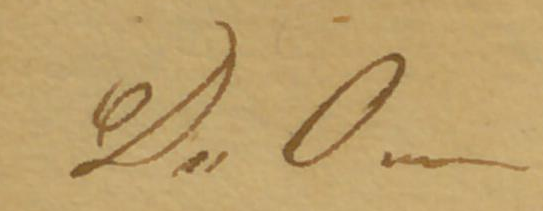D.O-
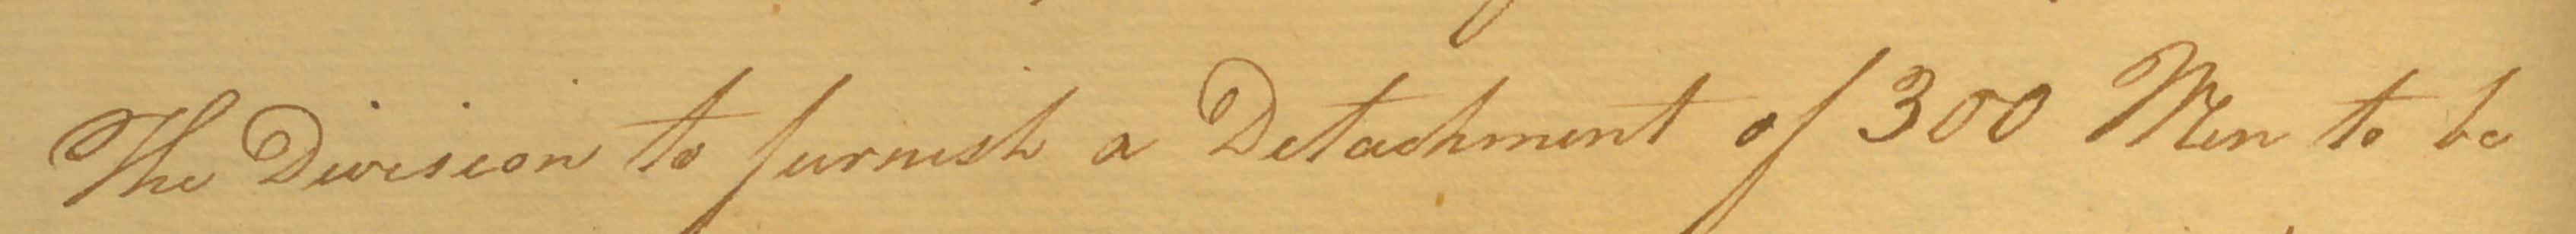The Division to furnish a Detachment of 300 Men to be
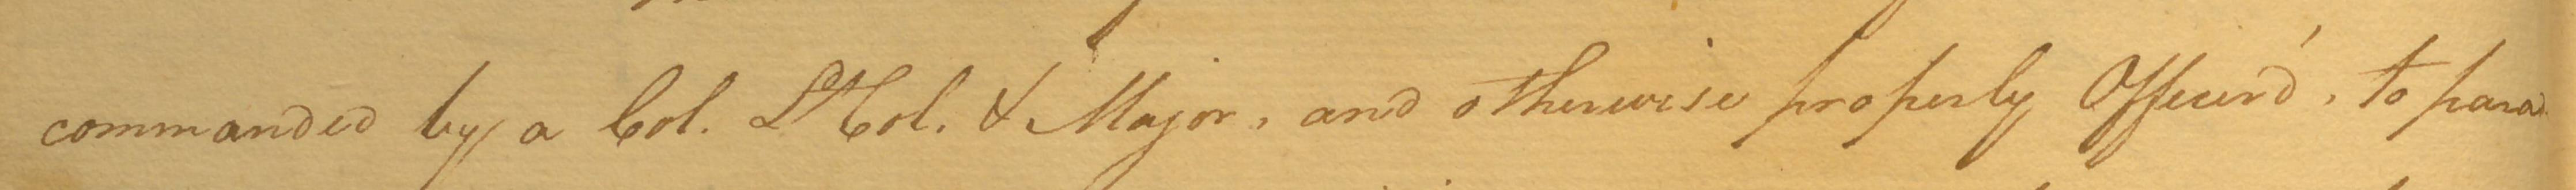commanded by a Col. L^t. Col. & Major, and otherwise properly Offered, to parade
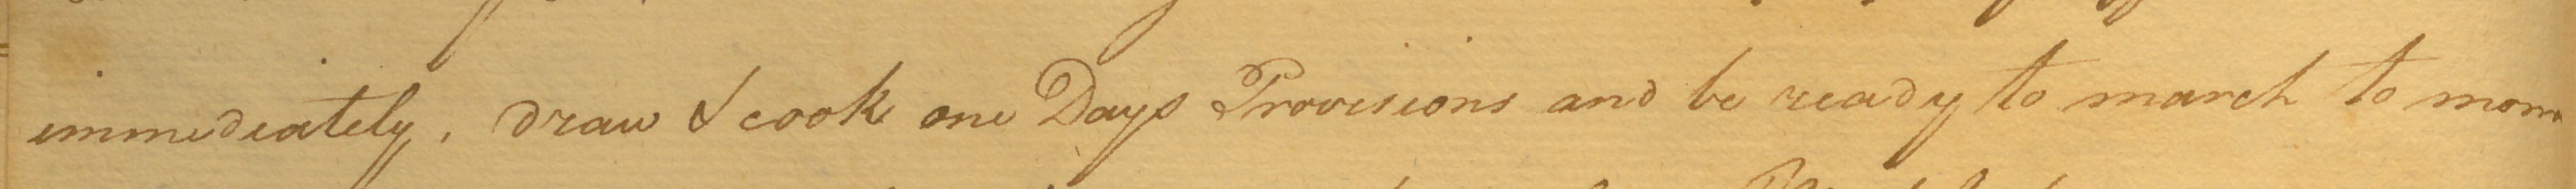immediately. draw & cook one Days Provisions and be ready to march to morr
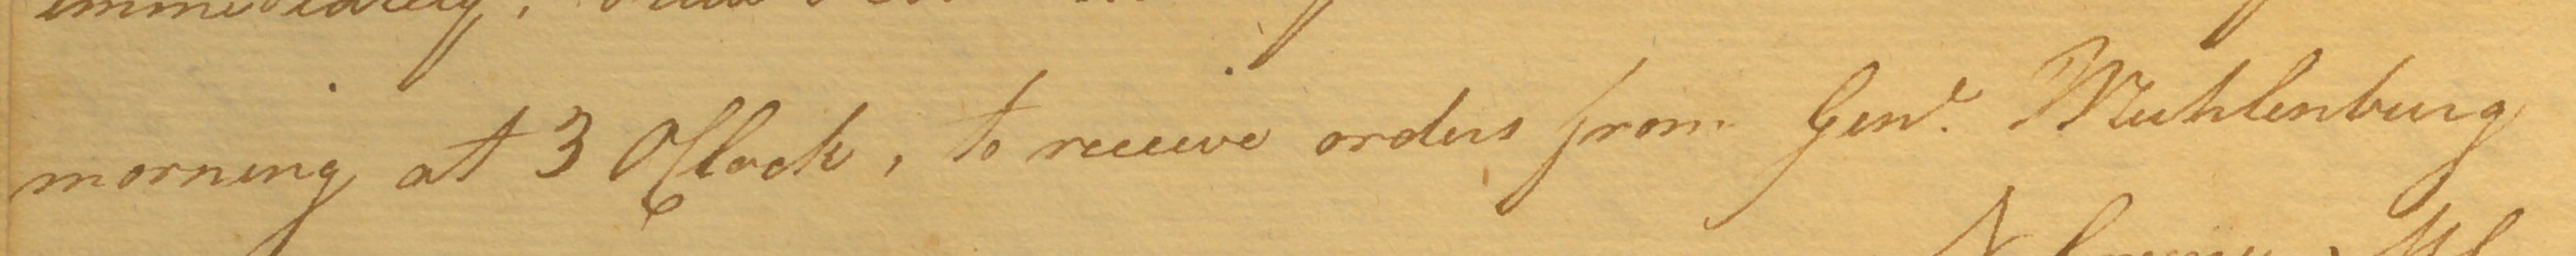morning at 3 oClock, to receive orders from Gen^l. Muhlenburg
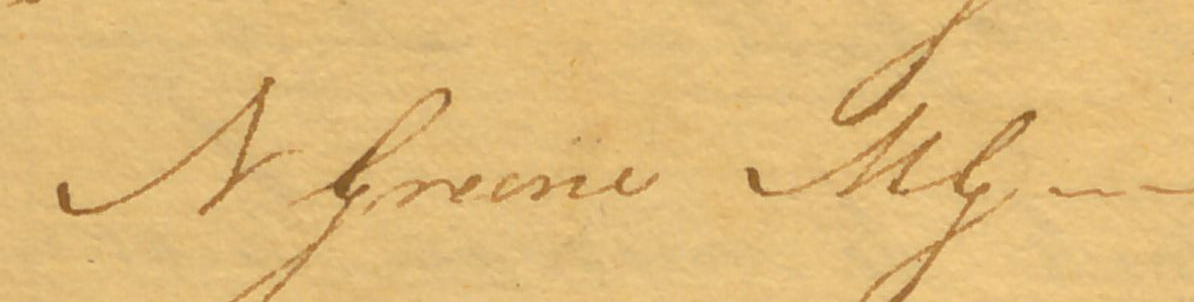N Greene MG--
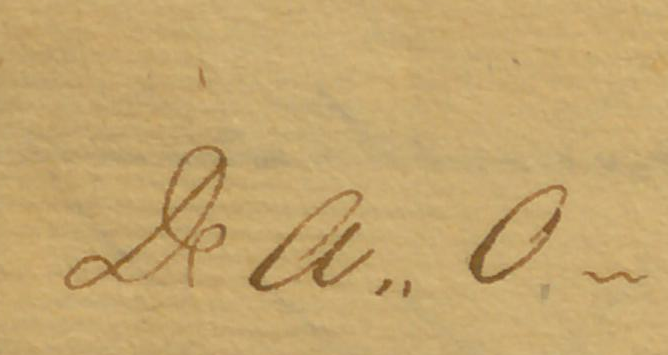D A. O-
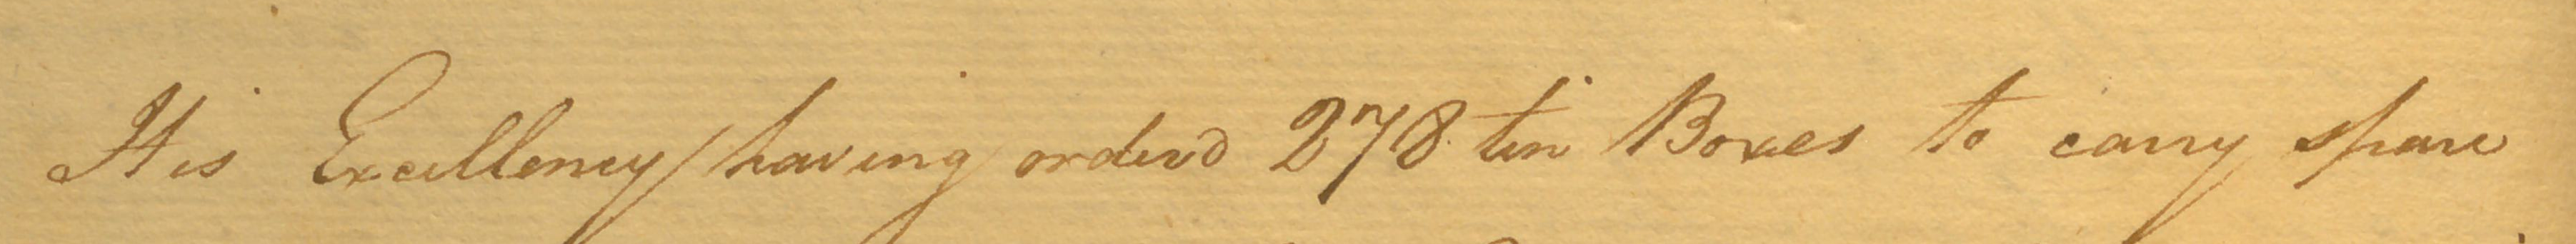His Excellency having orderd 278 tin Boxes to carry spare
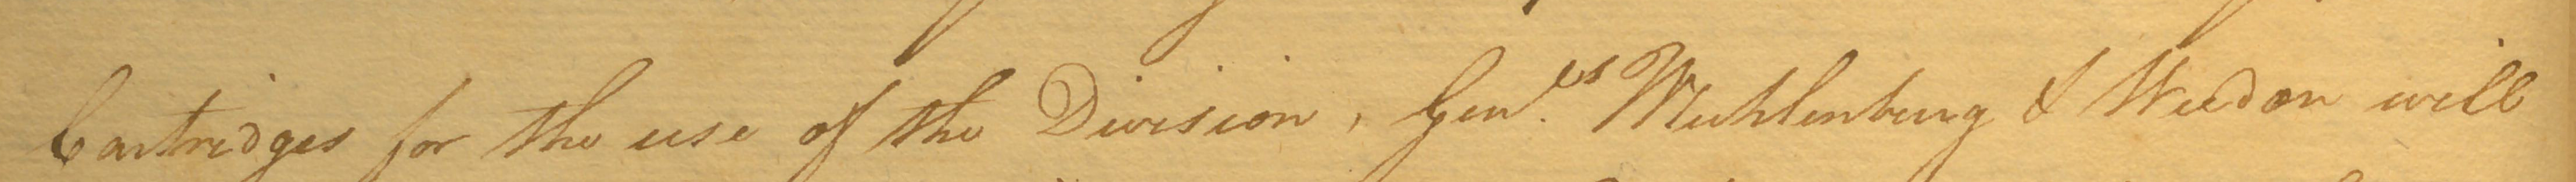Cartridges for the use of the Division, Gen^ls Muhlenburg & Weedon will
